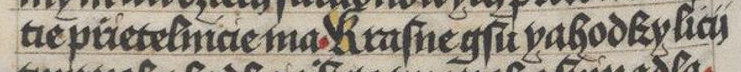tie pṙietelnicie ma.Kraſne gſu yahodky licij
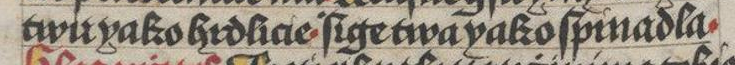twu yako hrdlicie.ẛige twa yako ſpinadla.
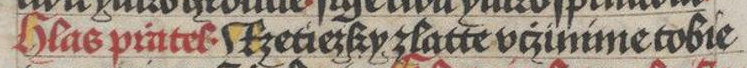Hlas pṙatel.Rzetiezky zlatte vcżinime tobie
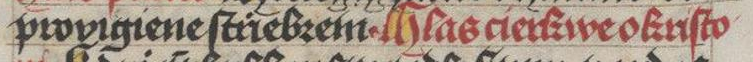provigiene ſtṙiebrem.Hlas cíerkwe o kriſto¬
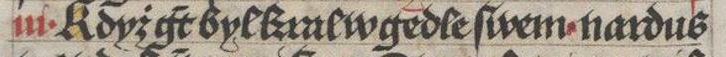ui.Kdyż ḡt byl kral w gedle ſwem.nardus
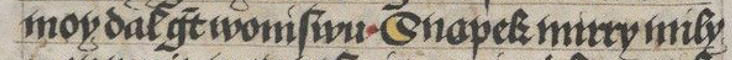moy dal ḡt woni ſwu.Snapek mirry mily
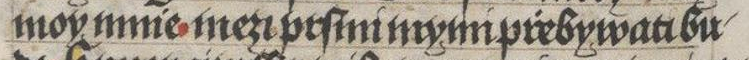moy mnie.mezi prſmi mymi pṙebywati bu¬
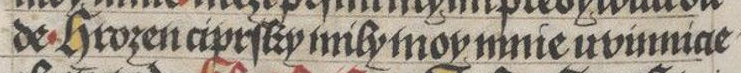de.Hrozen ciprſky mily moy mnie u vinnicie¬
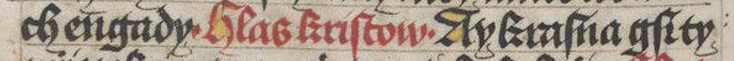ch engady Hlas kriſtow.Ay kraſna gſi ty
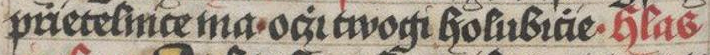pṙietelnice ma ocżi twogi holubiċie.Hlas
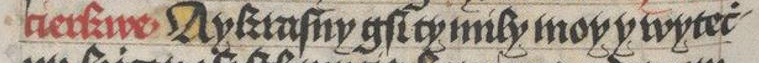cierkwe. Ay kraſny gſi ty mily moy y wyteċ¬
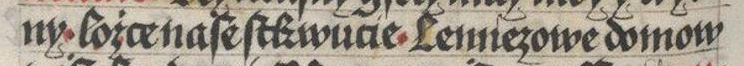ny lożce naẛe ſtkwucie.Lemiezowe domow
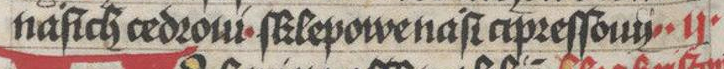naẛich cedrouí.ſklepowe naẛi cipreſſouij.II.
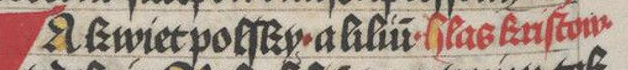A kwiet polſky·a liliū. hlas kriſtow .
